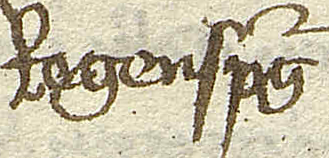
Regenſp*g
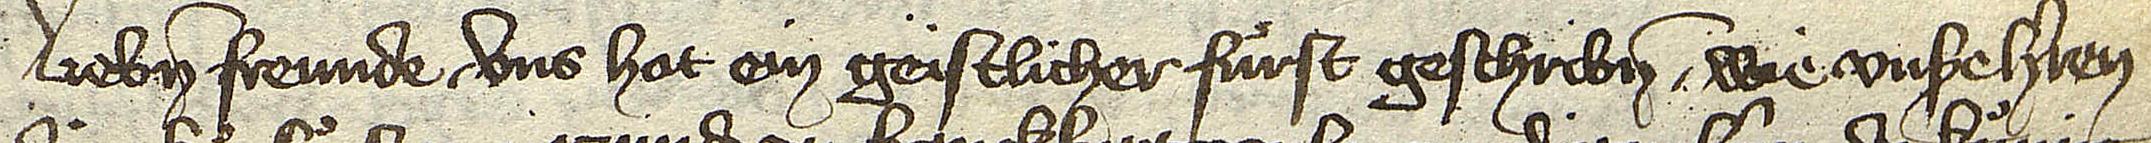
Liebn* freunde / vns hat ein geiſtlicher fürſt geſchribn* / wie vnſ*e h*ren
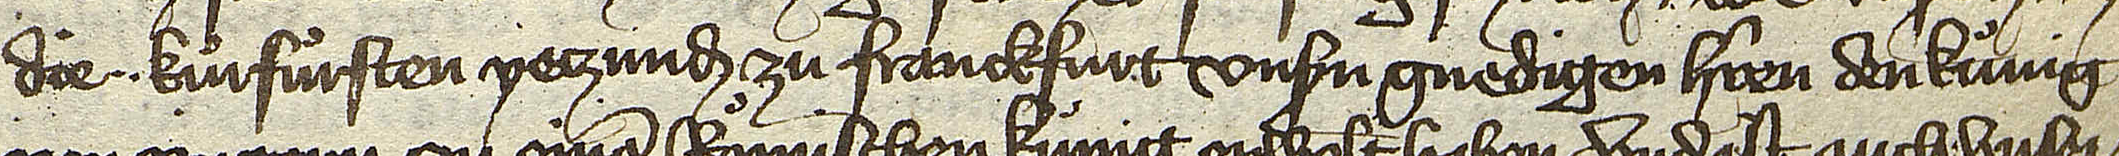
die ~ kürfürſten yecʒund cʒu franckfurt vnſ*n gnedigen h*ren den künig
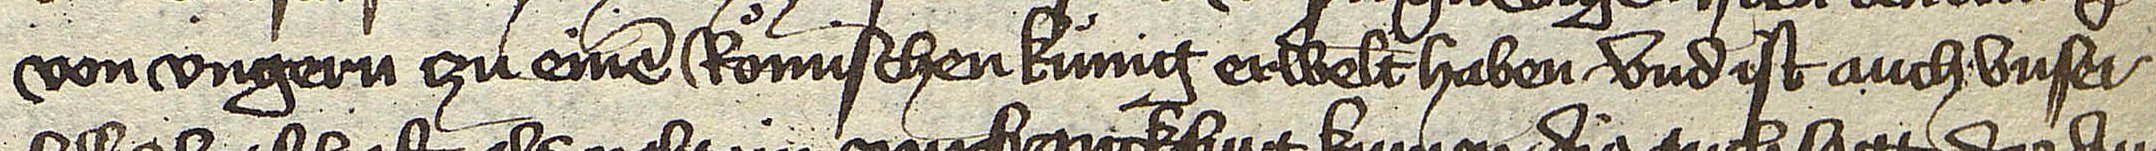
von vngern cʒu eine* Römiſchen künig erwelt haben / vnd iſt auch vnſer
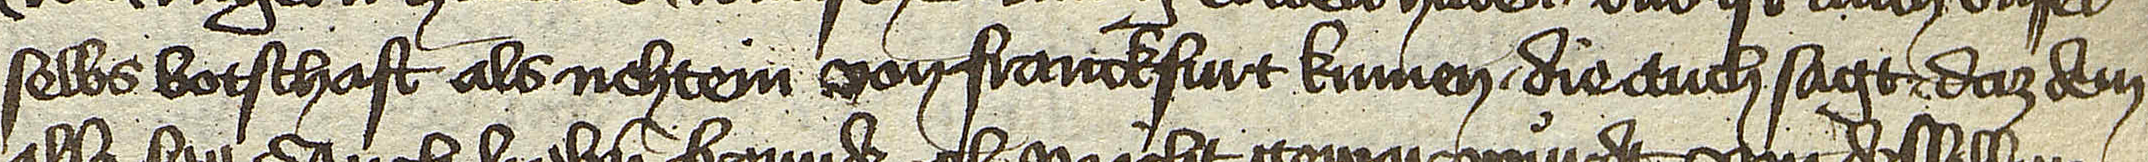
ſelbs botſchaft als nehtein von franckfurt kumen / die auch ſagt / daʒ dem
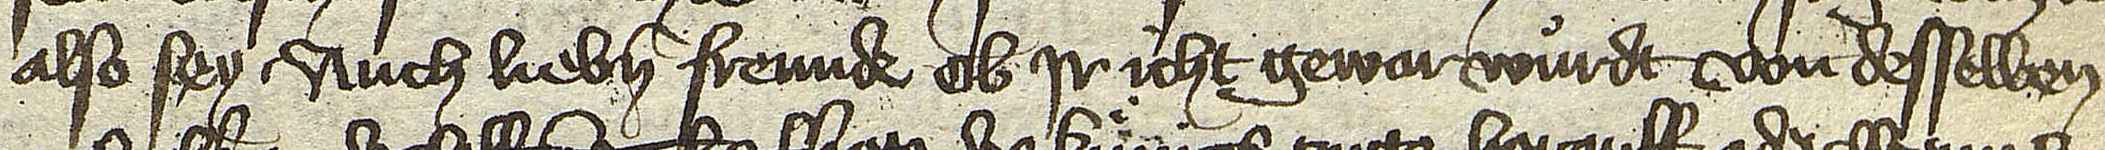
alſo ſey / Auch liebn* freunde Ob Ir icht gewar würdt von deſſelben
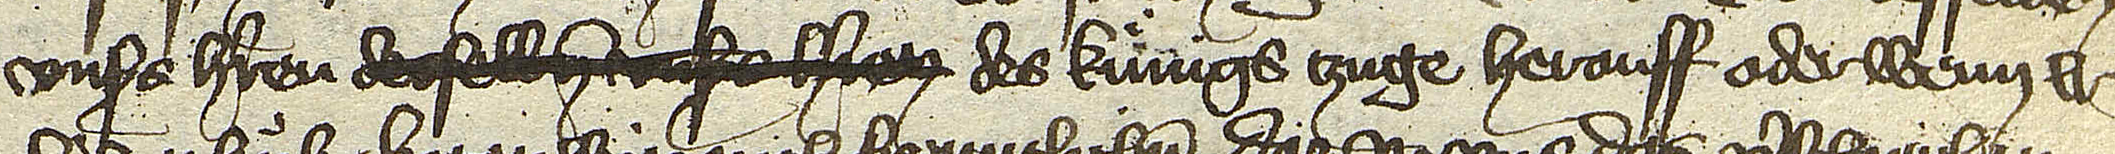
vnſ*s h*ren desſelbn* vnſ*s h*ren des künigs cʒuge herauff oder wenn Er
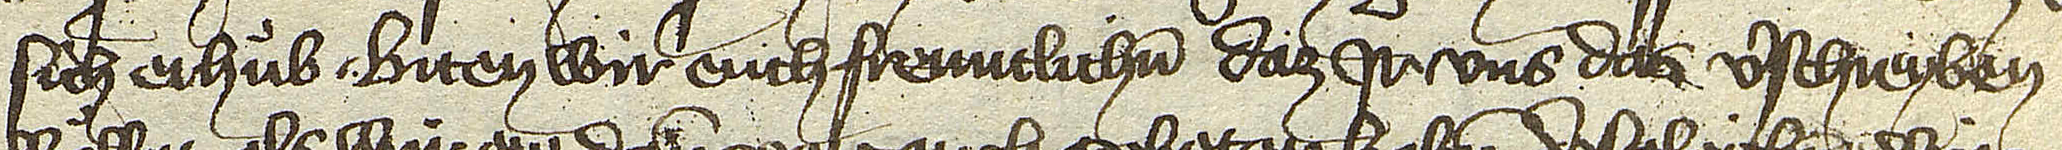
ſich erhüb / biten wir euch freuntlichn* daʒ Ir vns das v*ſchreyben
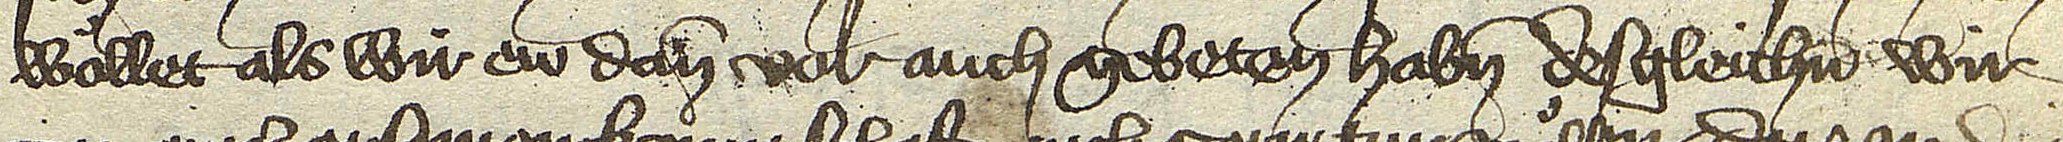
wöllet als wir ew dan* vor auch gebeten habn* deſgleichn* wir
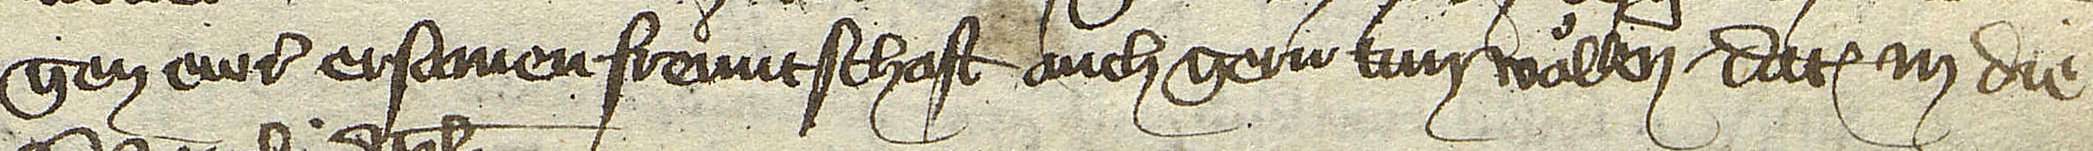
gen ewr* erſamen freuntſchaft auch gern tun wöllen / dat* in die
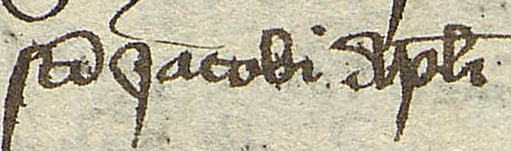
ſci* Iacobi Apli*
